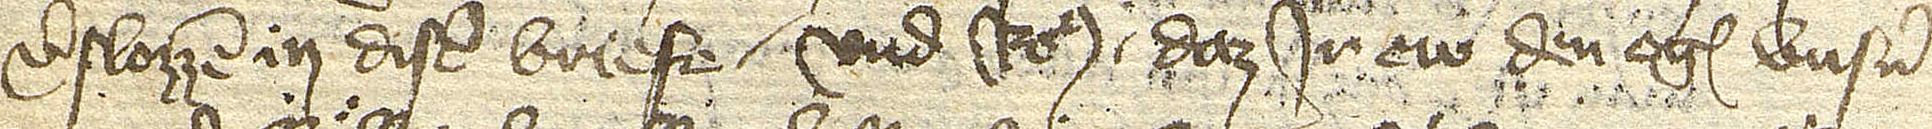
v*ſloʒʒe* in diſe* briefe / vnd Ro* / daʒ Ir ew den eg* vnſn*
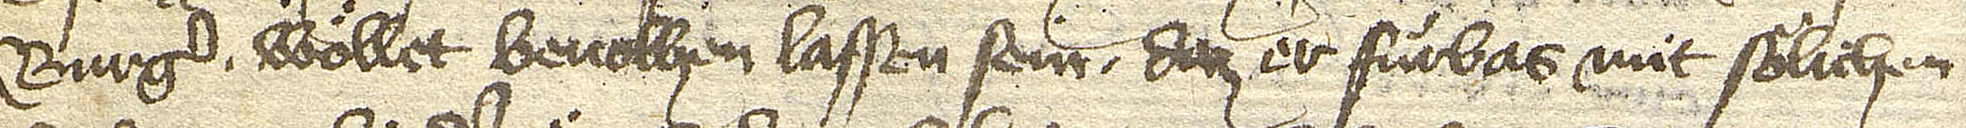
Burg* / wöllet beuolhen laſſen ſein / daʒ er fürbas mit ſölichen
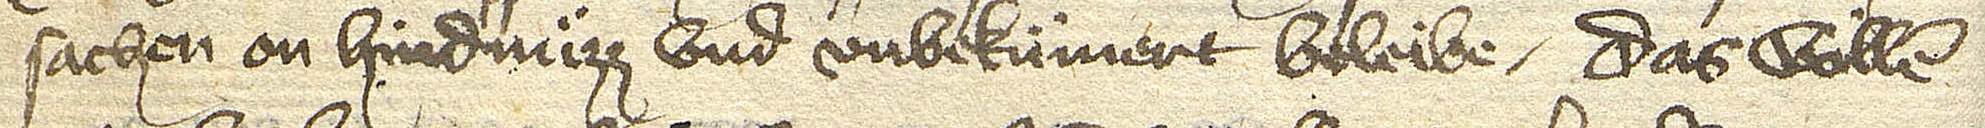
ſachen on hind*nüʒʒ vnd vnbekümert beleibe / Das wölle*
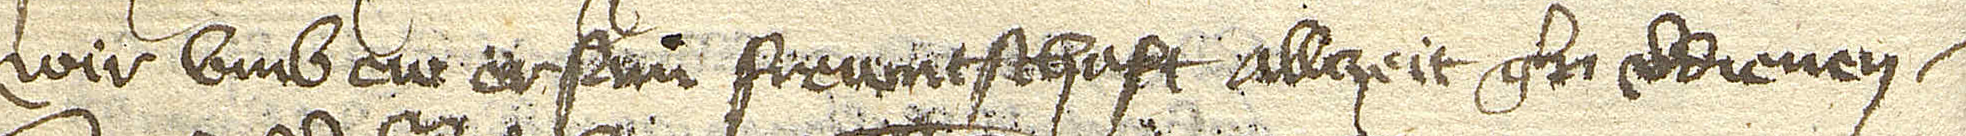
wir vns ew erſam freuntſchaft allcʒeit gn* v*dienen /
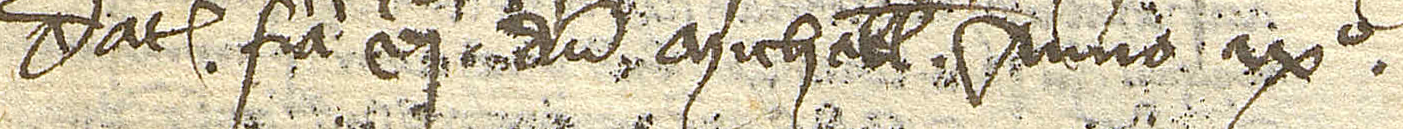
Dat* . fia* vi* / An* Michael* . Anno ix* .
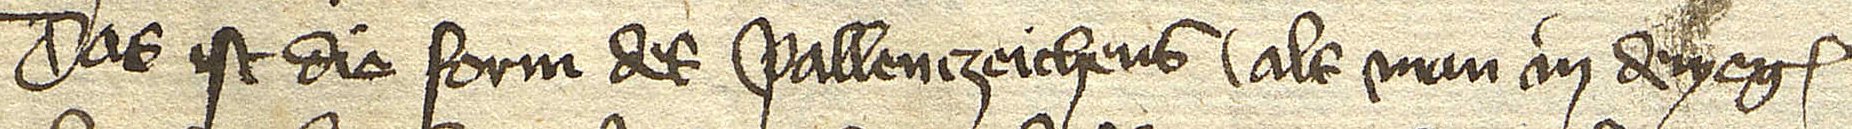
Das iſt die form des Pallencʒeichens / als man in dem eg*
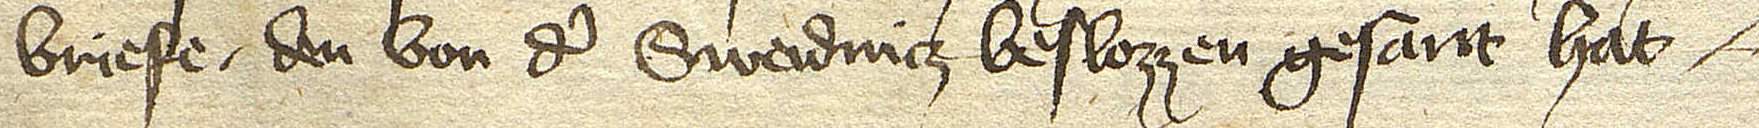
briefe / den von d* Sweidnicʒ beſloʒʒen geſant hat /
